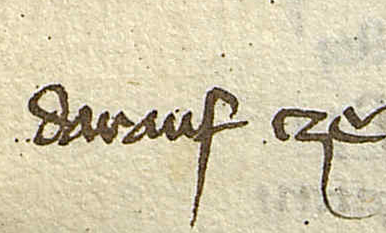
darauf cʒe
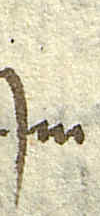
Im
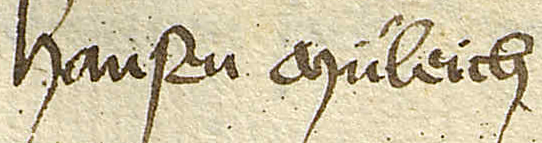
hanſen Müleich
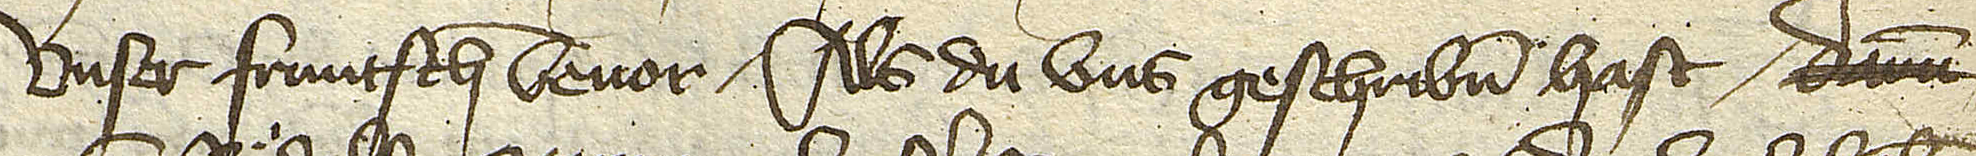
Vnſer fruntſch* beuor / Als du vns geſchribn* haſt / daru*
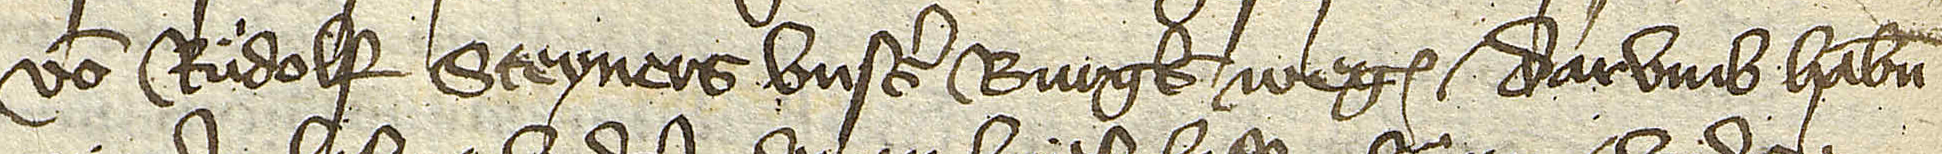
vo* Rüdolf Steyners vnſs* Burg*s weg* / Darvmb habn*
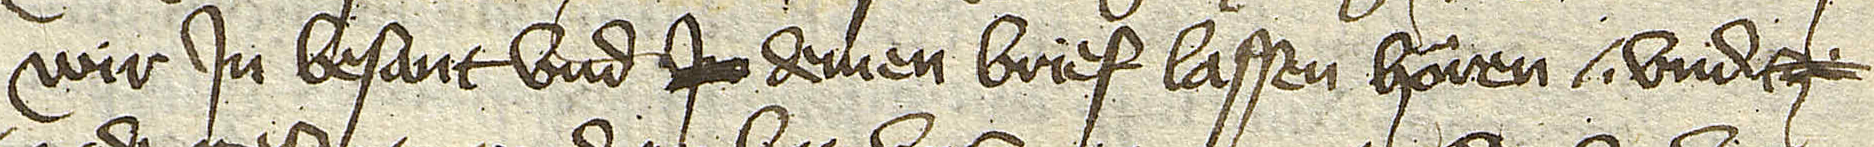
wir In beſant vnd Im deinen brief laſſen hören / . vnd cʒe
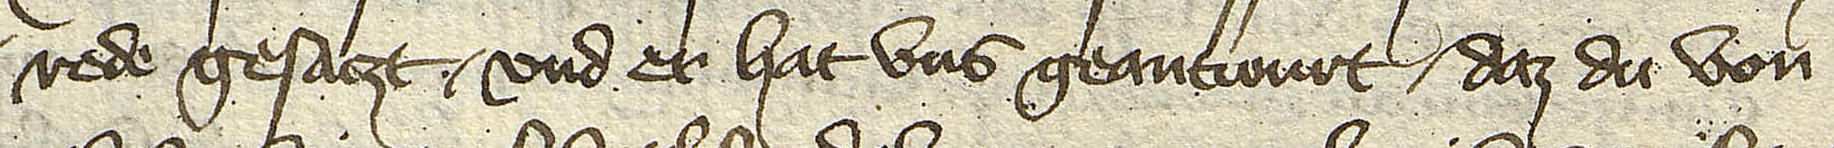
rede geſacʒt . / vnd er hat vns geantwurt / daʒ du von
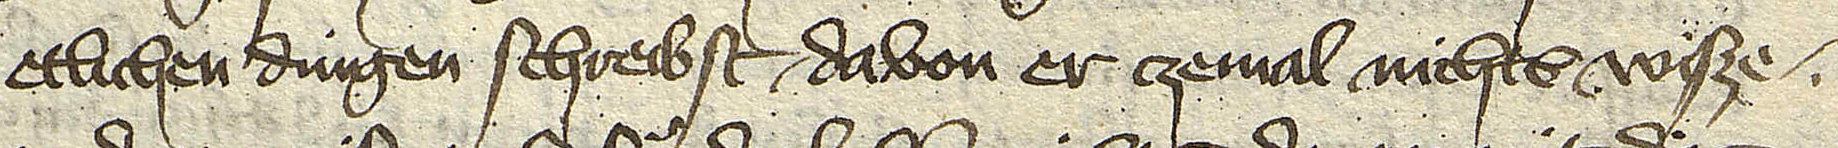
etlichen dingen ſchreibſt / davon er cʒemal nichts wiſʒe / .
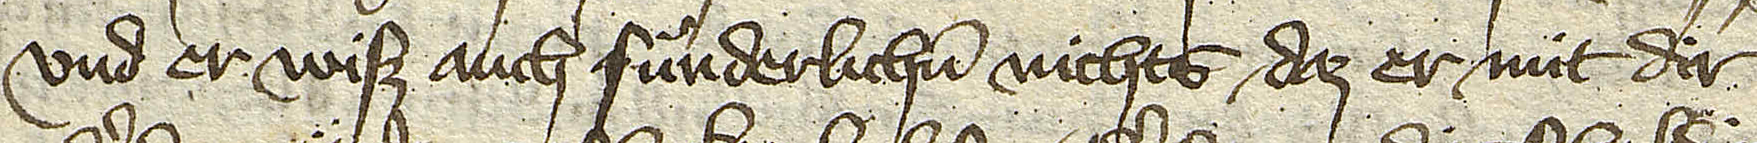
vnd er wiſʒ auch ſünderlichn* nichts / daʒ er mit dir
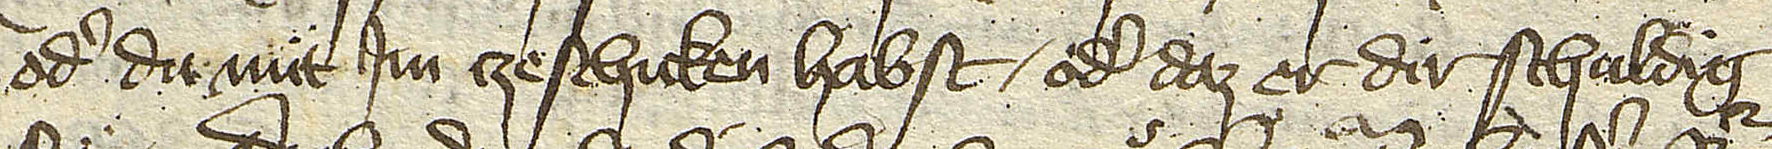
od* du mit Im cʒeſchicken habſt / od* daʒ er dir ſchuldig
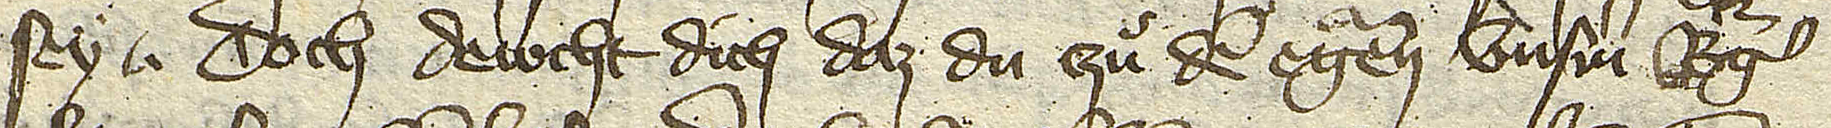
ſey / . Doch dewcht dich daʒ du cʒü d* egen* vnſm* B*g*
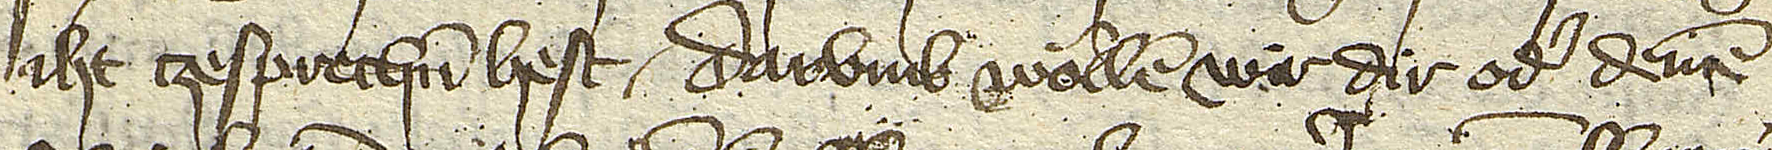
iht cʒeſprechn* heſt / Darvmb wölle* wir dir od* deine*
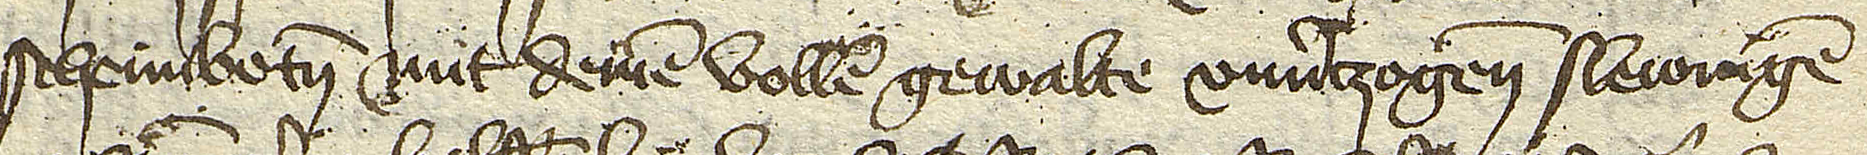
ſcheimbotn* mit deine* volle* gewalte vnu*cʒogen* ſlewnige*
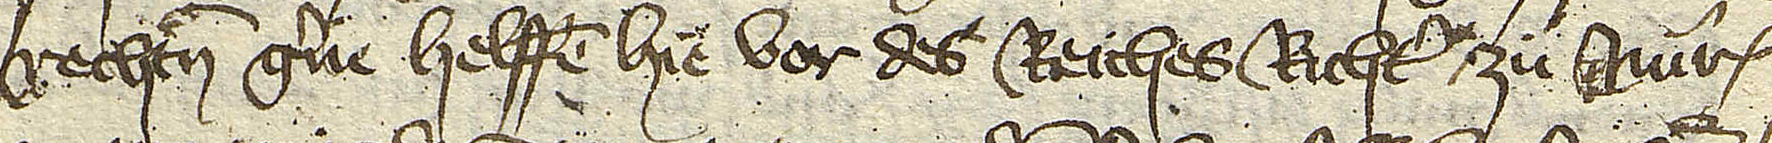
rechtn* g*ne helffe* hie vor des Reiches Richt* cʒü Nür*
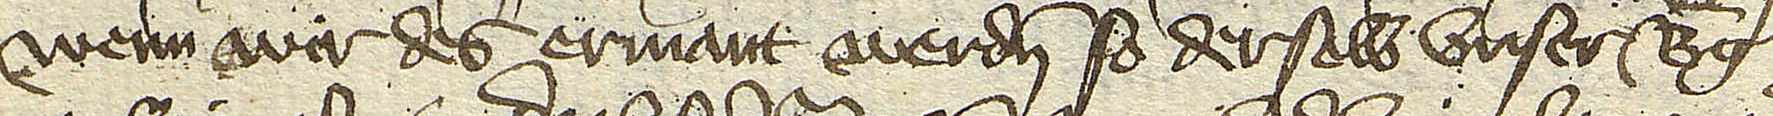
wenn wir des ermant werdn* ſo derſelb vnſer B*g*
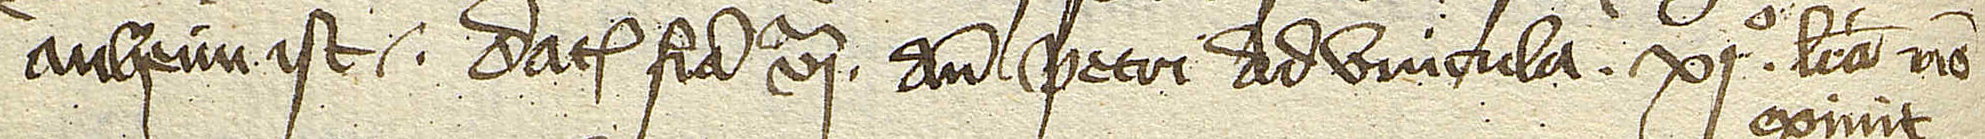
anheim iſt / . Dat* fia* vi* an* petri Advincula . xi* lra* no*
